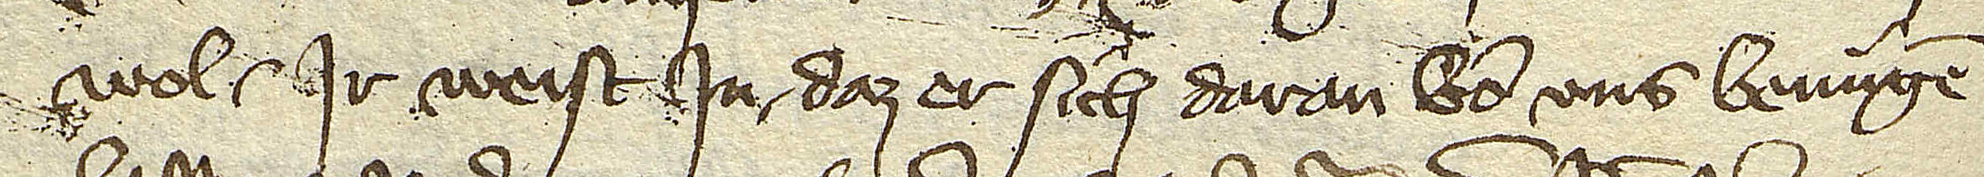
wol / Ir weiſt In / daʒ er ſich daran vo* vns benüge*
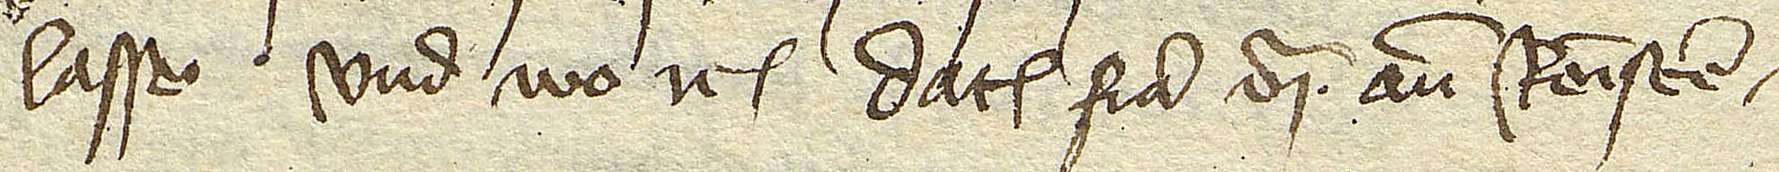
laſſe vnd wo ec* dat* fia* vi* . an* Reiſce* /
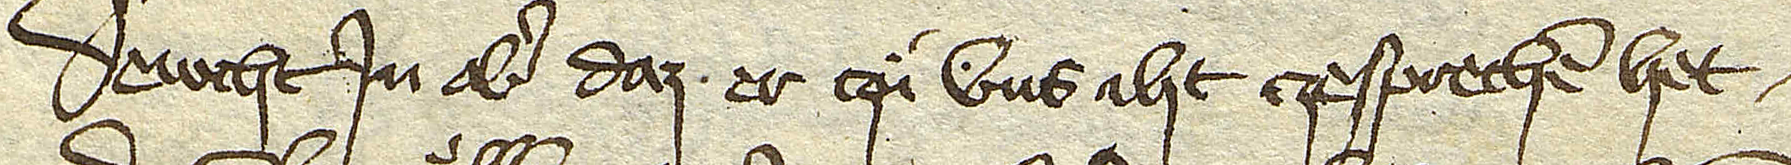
dewcht In ab* daʒ er cʒü vns iht cʒeſpreche* het /
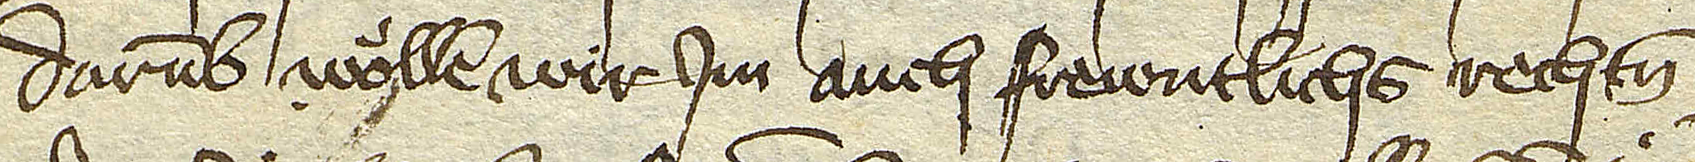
darüb* wölle* wir Im auch frewntlcihs rechtn*
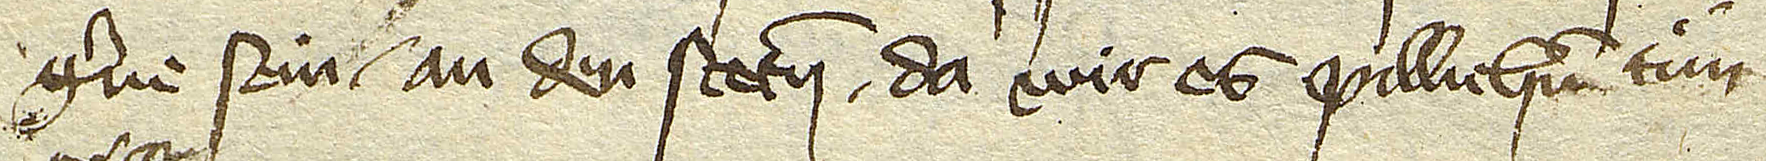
g*ne ſein / an den ſtetn* / da wir es pillichn* tün
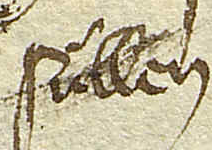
ſüllen
